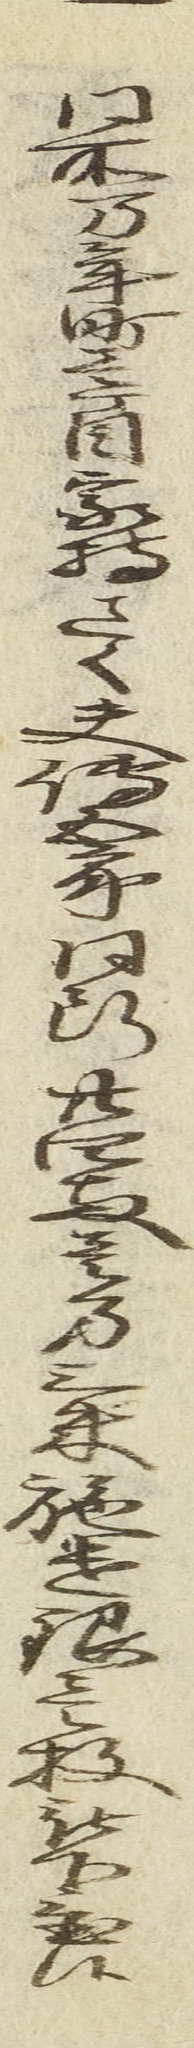一同所万年町壱丁目家持さく夫伝五郎同断廿四両壱分三朱施遣銀壱枚被下置候
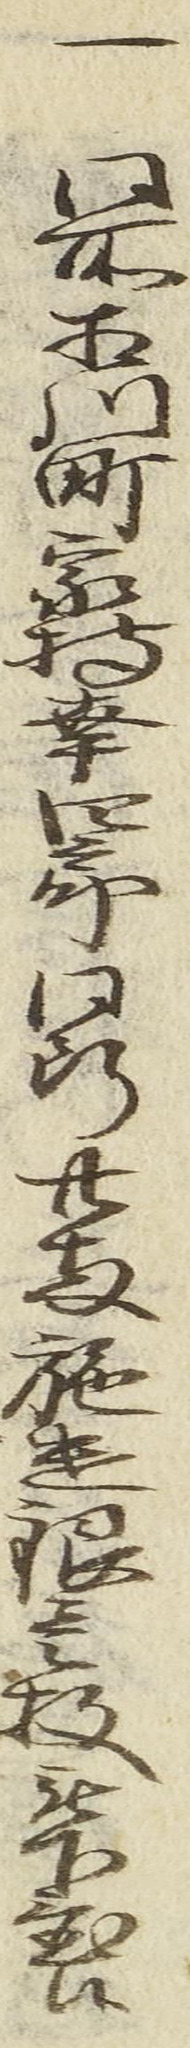一同所相川町家持幸四郎同断廿両施遣銀壱枚被下置候
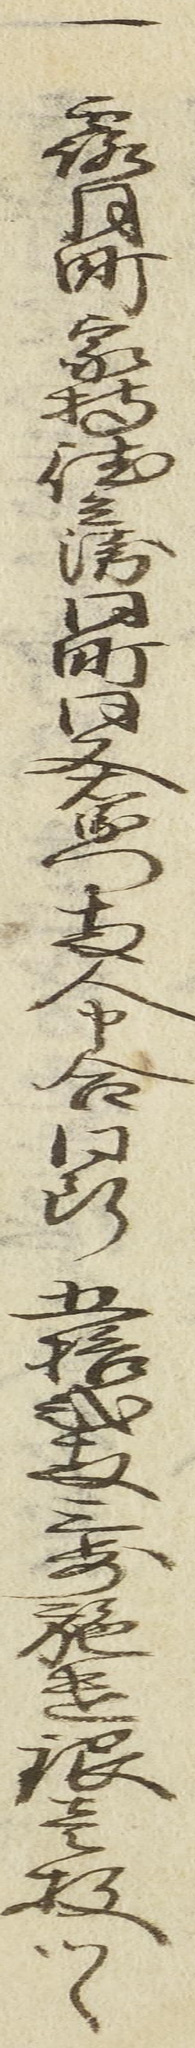一露月町家持徳兵衛同町同又右衛門両人申合同断五拾弐両三歩施遣銀壱枚ツヽ
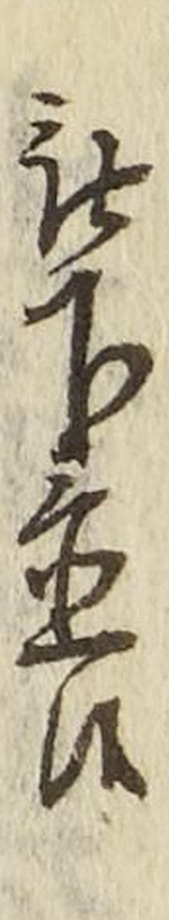被下置候

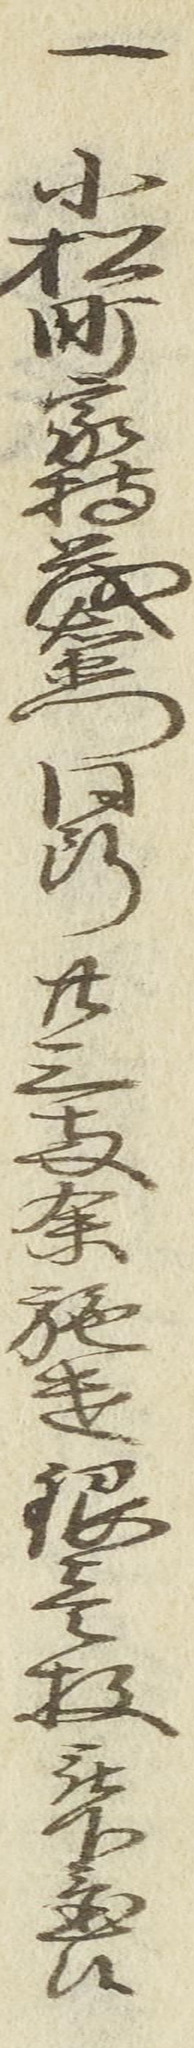一小松町家持茂右衛門同断廿三両余施遣銀壱枚被下置候
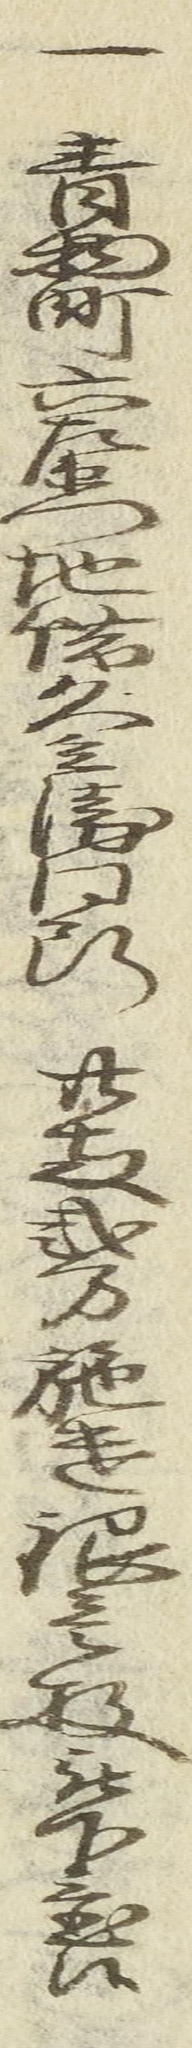一青物町六左衛門地借久兵衛同断廿両弐分施遣銀壱枚被下置候
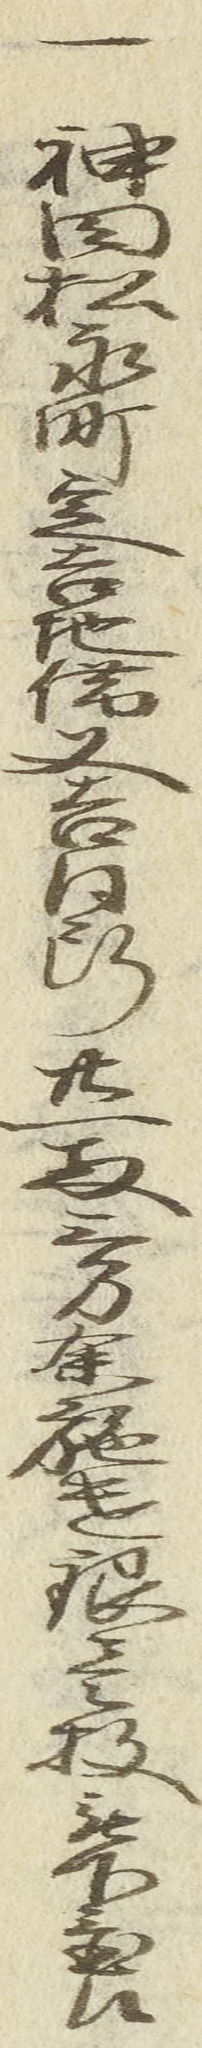一神田松永町定吉地借又吉同断廿一両三分余施遣銀壱枚被下置候
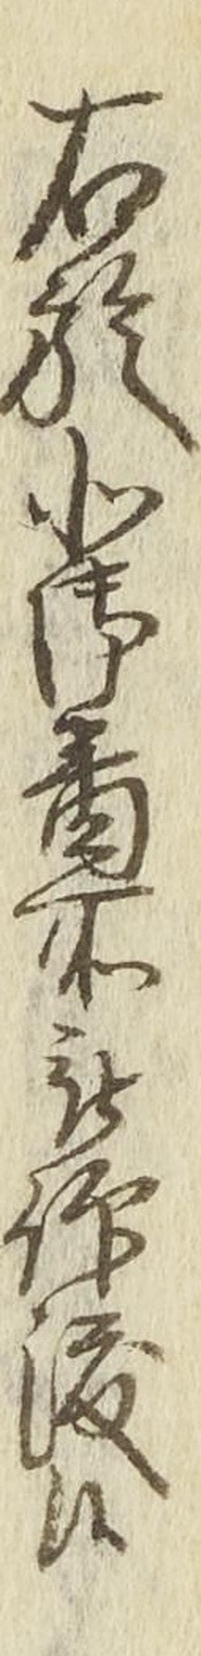右於北御番所被仰渡候
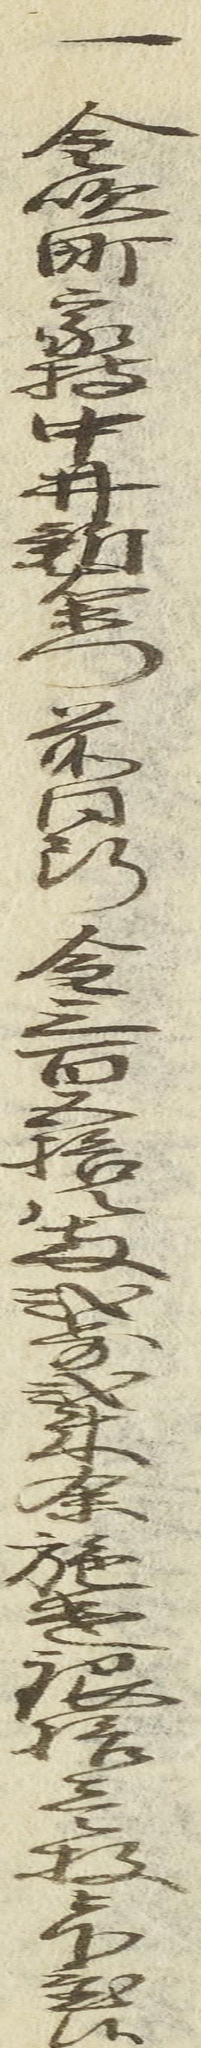一金吹町家持中井新右衛門前同断金三百五拾八両弐歩弐朱余施遣銀拾壱枚被下置候
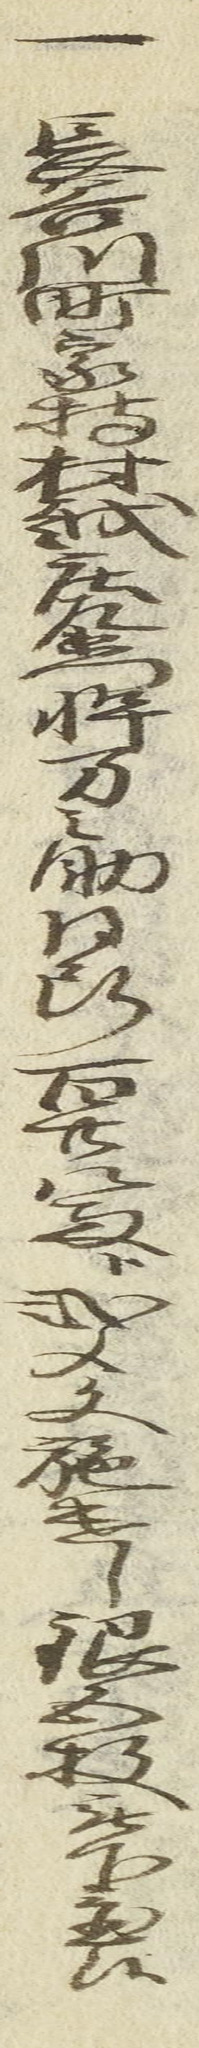一長谷川町家持村越庄左衛門悴万之助同断百廿八両ト弐貫文施遣し銀五枚被下置候
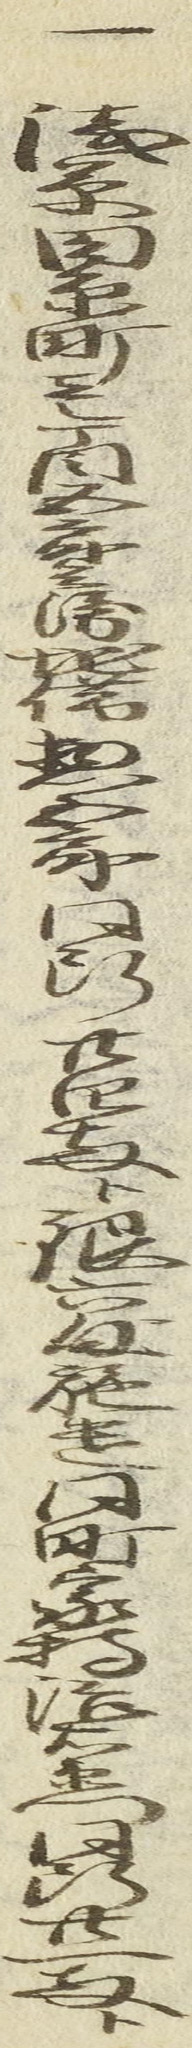一浅草田原町壱丁目五郎兵衛地借惣五郎同断廿四両ト銀六匁施遣同町家持治右衛門同断廿一両ト
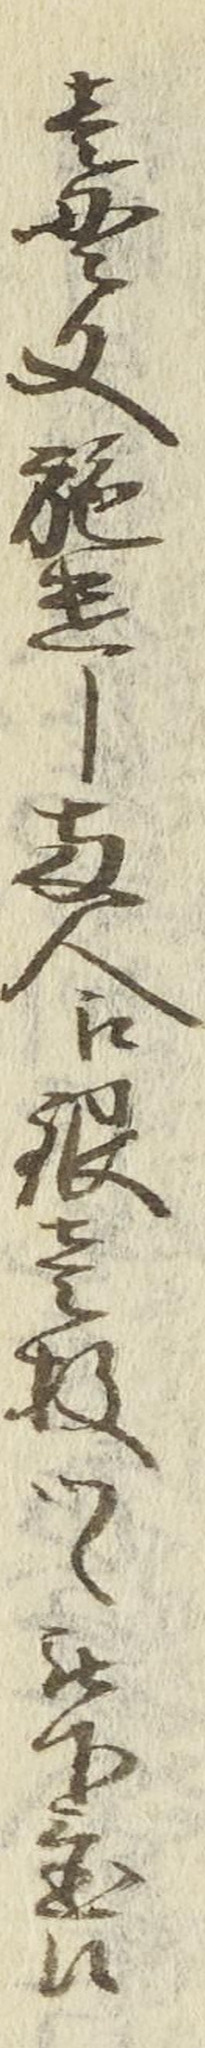壱貫文施遣し両人江銀壱枚ツヽ被下置候
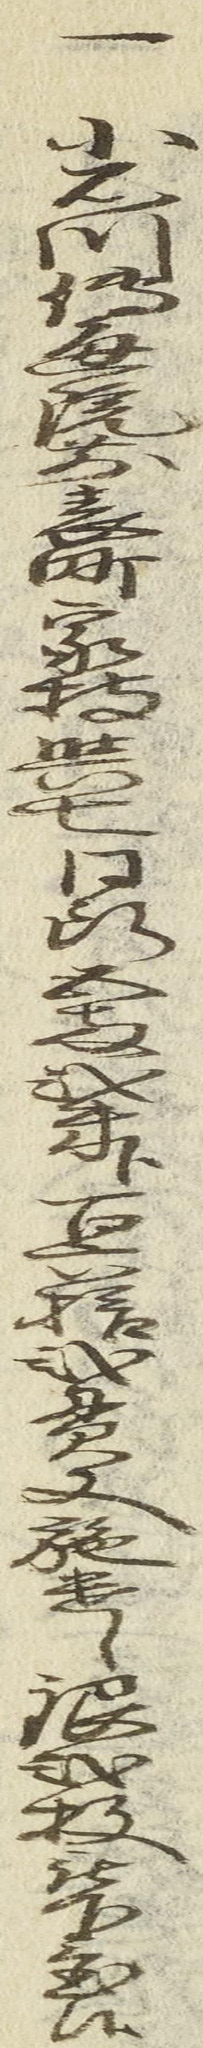一小石川伝通院前表町家持与七同断五両弐朱ト百六拾弐貫文施遣し銀弐枚被下置候
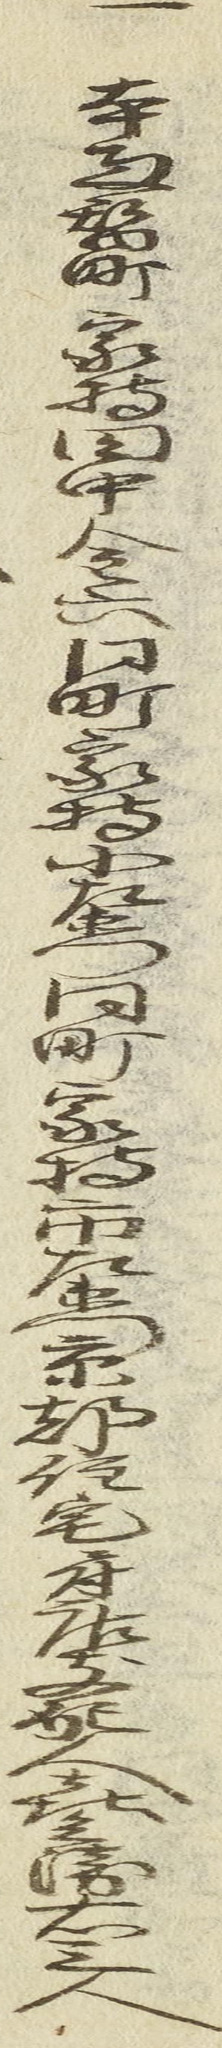一本両替町家持田中金六同町家持小左衛門同町家持市左衛門京都住宅ニ付店支配人喜兵衛右三人
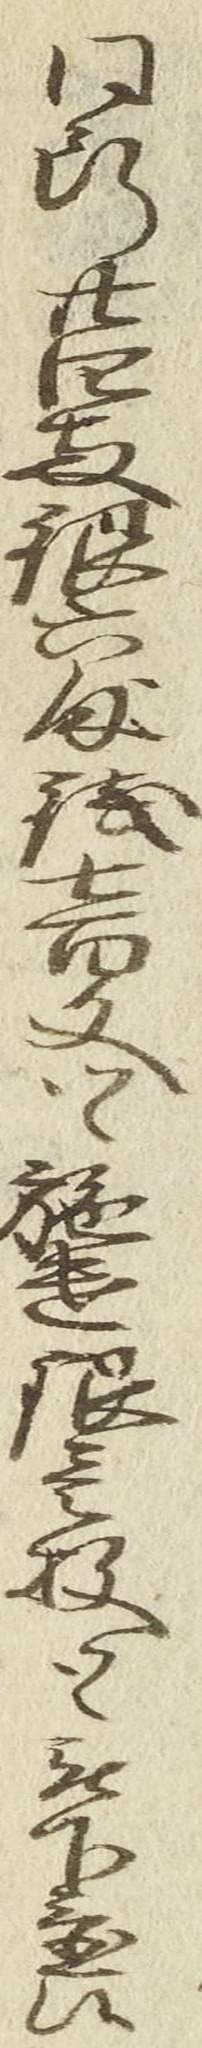同断廿四両銀六匁銭七百文ツヽ施遣銀壱枚ツヽ被下置候
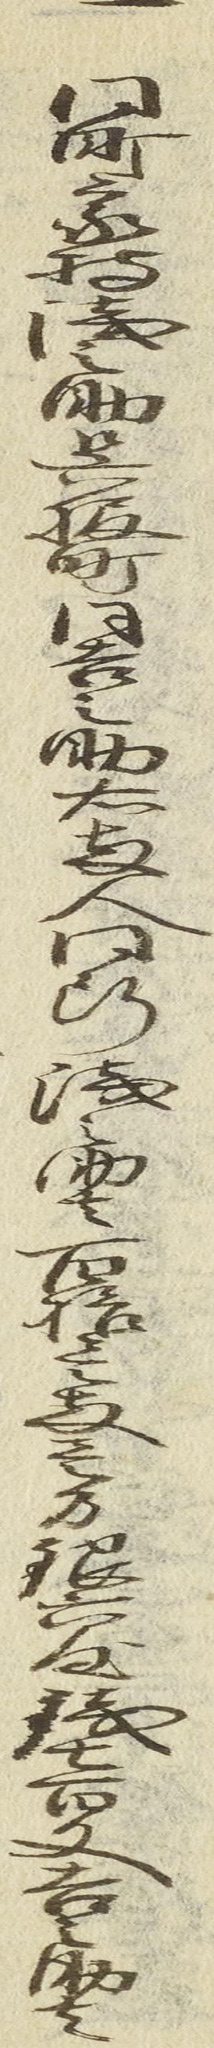一同町家持浅之助呉服町同吉之助右両人同断浅之助者百拾壱両壱分銀六匁銭七百文吉之助者
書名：安政二年震災記事　完
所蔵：東京大学地震研究所図書室 Earthquake Research Institute Library, The University of Tokyo, JAPAN
